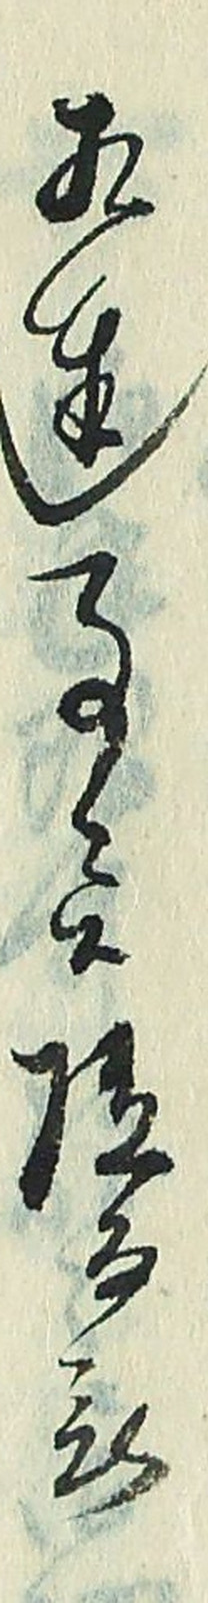相達事ニ候随而被
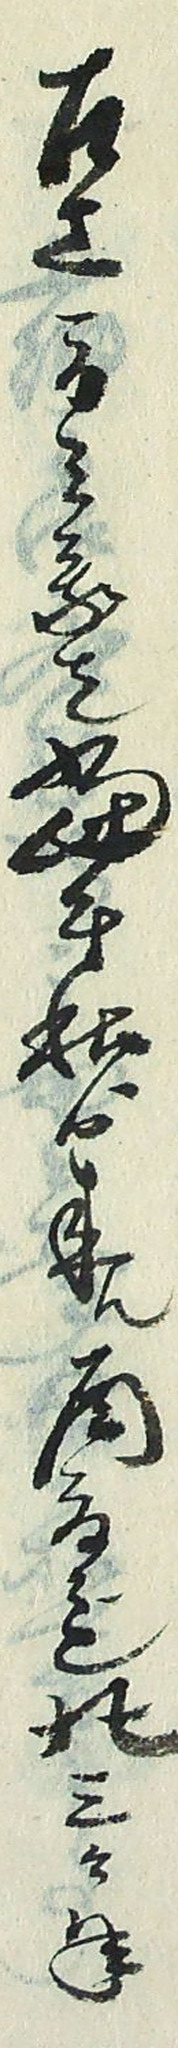召上方之義者當午秋ゟ来ル酉夏迄丸三ケ年
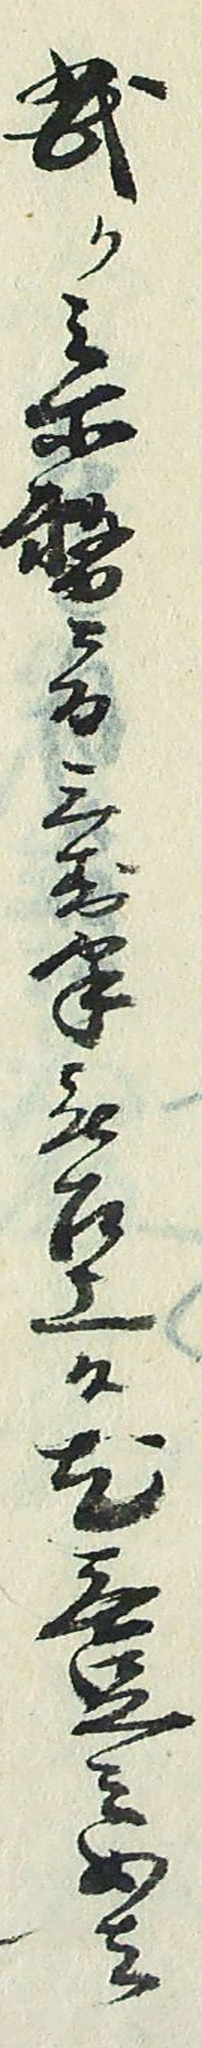當り之所務ニ而三歩半被召上候尤無足之義者
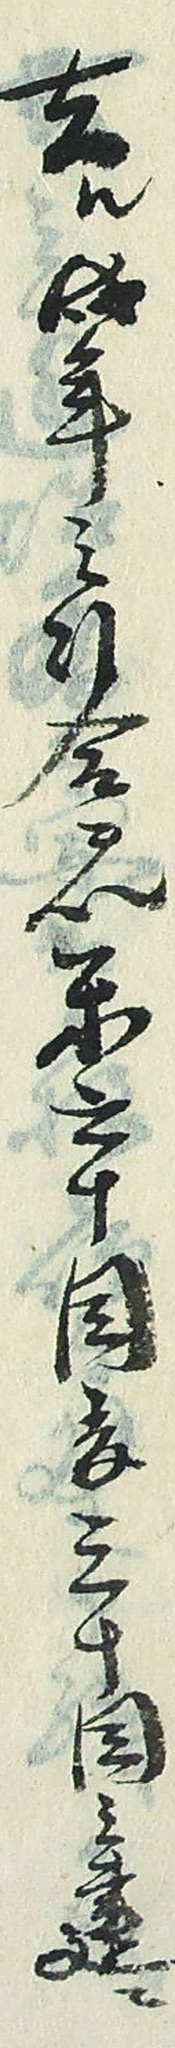去ル戌年之引合ヲ以米六十目麦三十目之建ニ
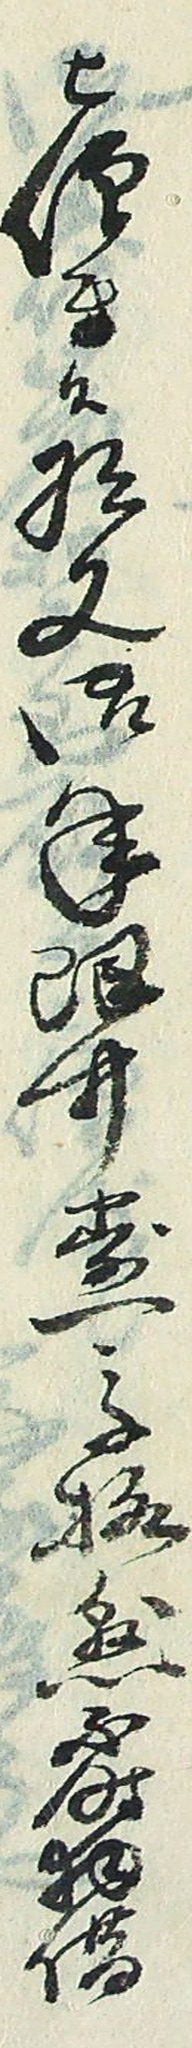被仰付候猶又御年限中歩一高格懸不時拝借
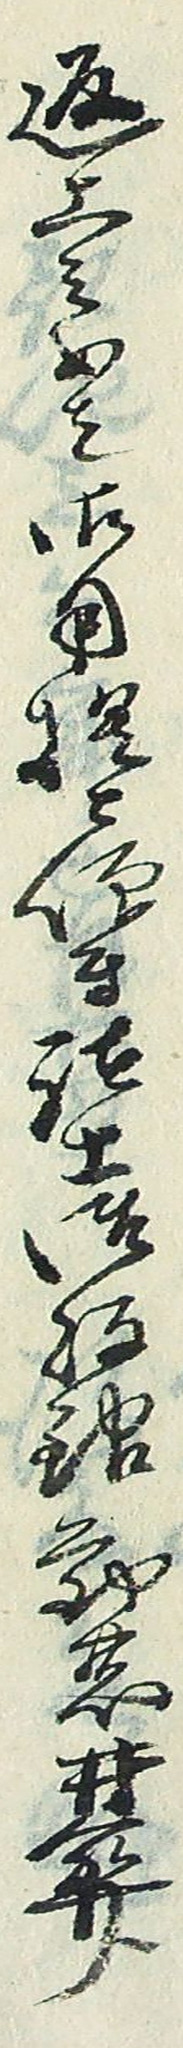返上之義者御用捨被仰付諸士御役銀勧農井関

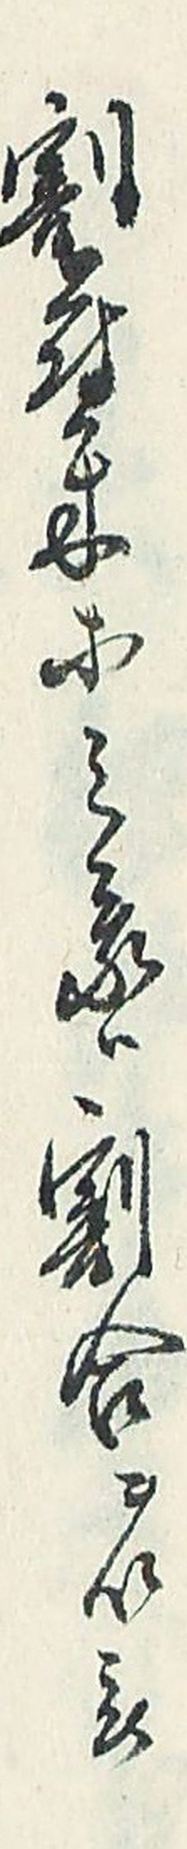割符米等之義ハ割合ヲ以被
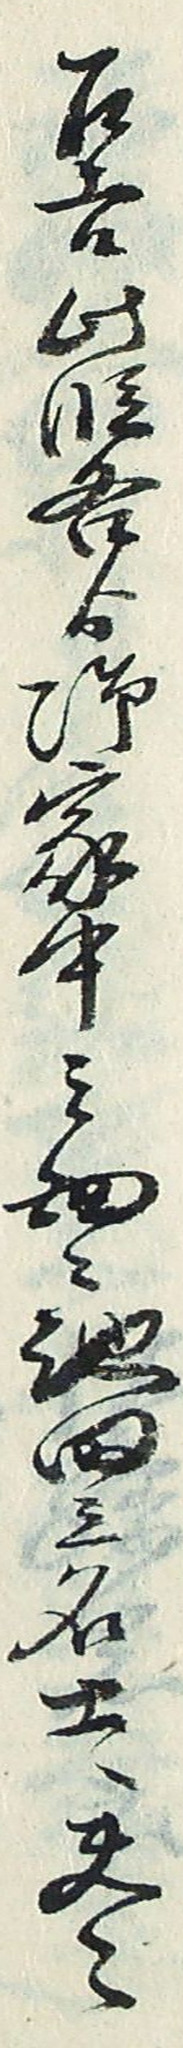召上候此段各ゟ御家中之面々池田三名士へ夫々
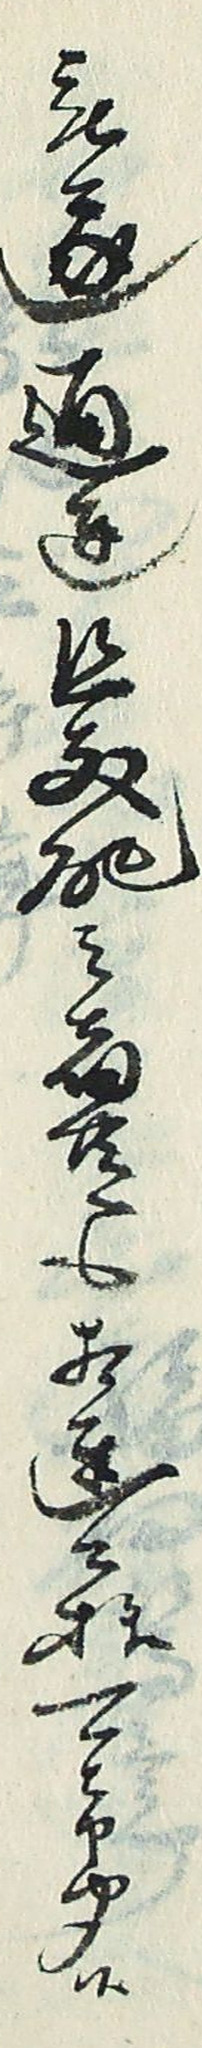被遂通達且支配之者共へも相達候様可被申聞候
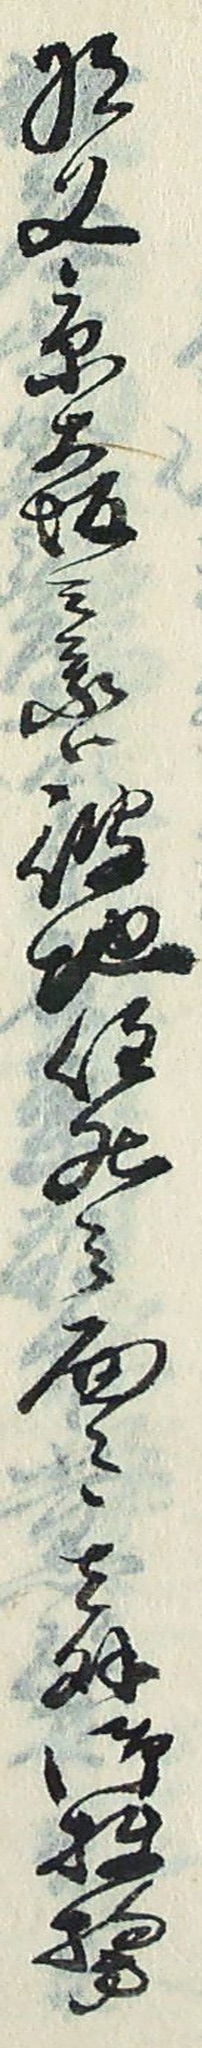猶又京大坂之義ハ彼地住居之面々其外御扶持方
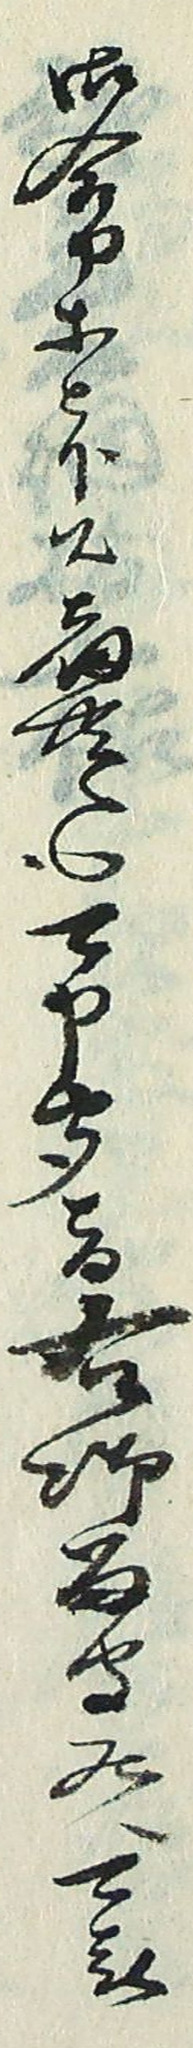御合力等被下候者共へも可申聞旨右御留守居へ可被
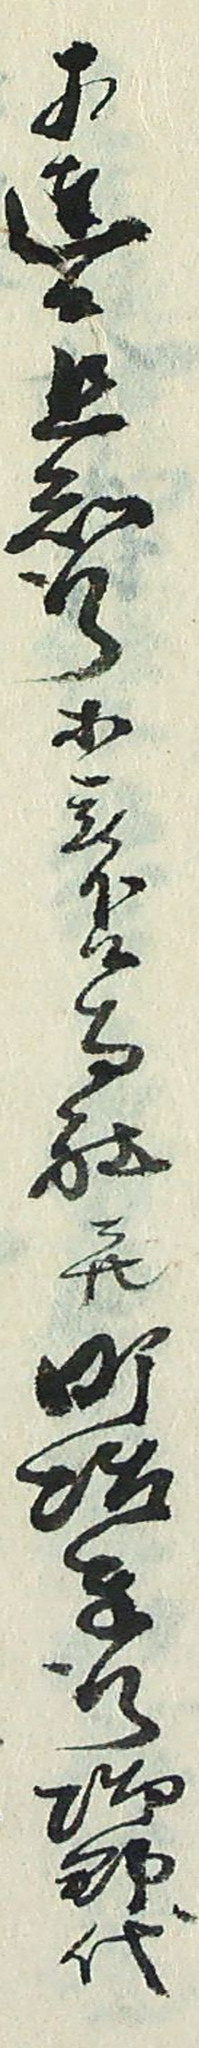相達候且知行等被下候寺社幷町御奉行御郡代
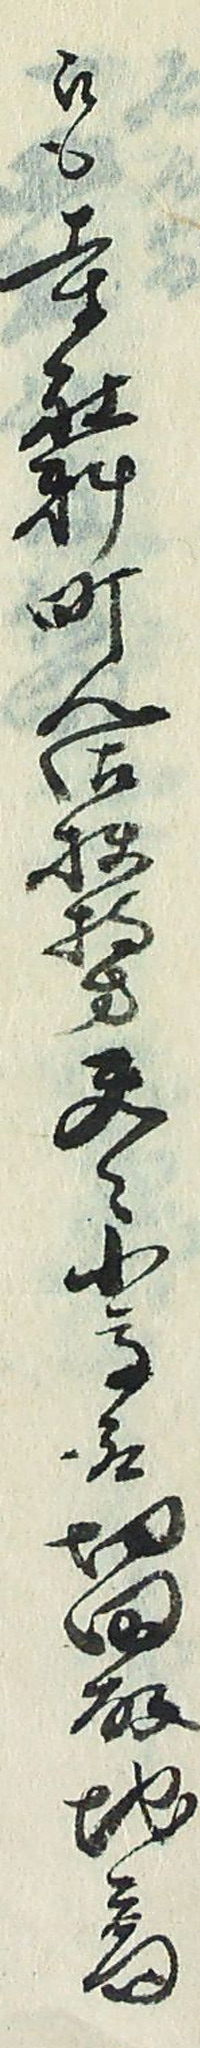江も寺社料町人御扶持方夫々小高取切田取地高
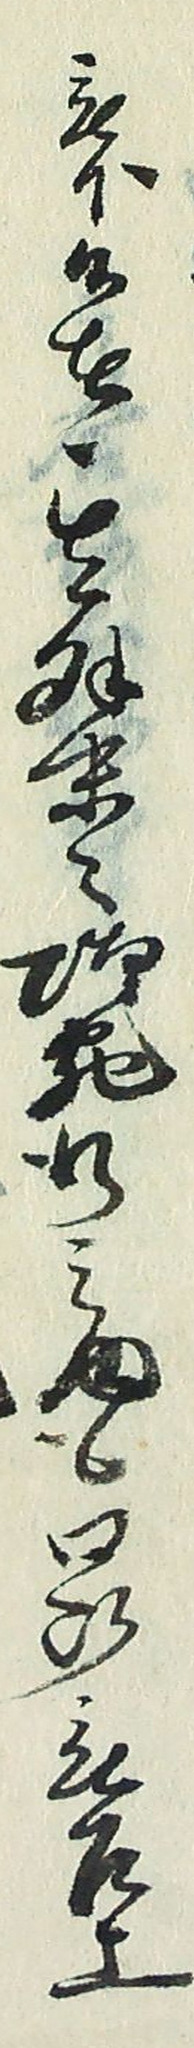被下候者其外末々御宛行之内も同断被召上
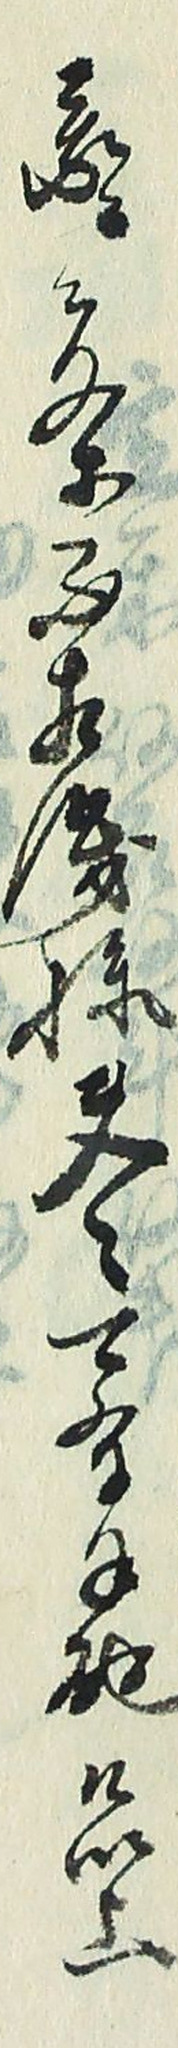義ニ候条不相洩様夫々可有手配候以上
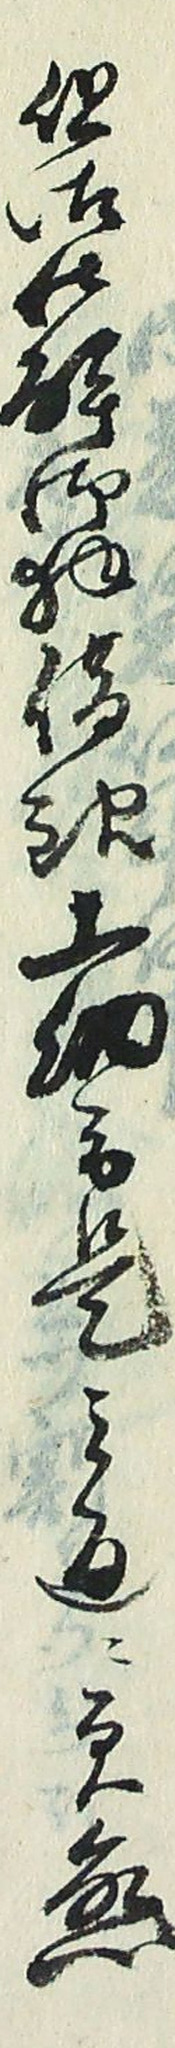但御仕解御拝借銀上納方是之通ニ而ハ愈
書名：諸御趣意書并御下知向之写
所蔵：鳴門教育大学 Naruto University of Education
